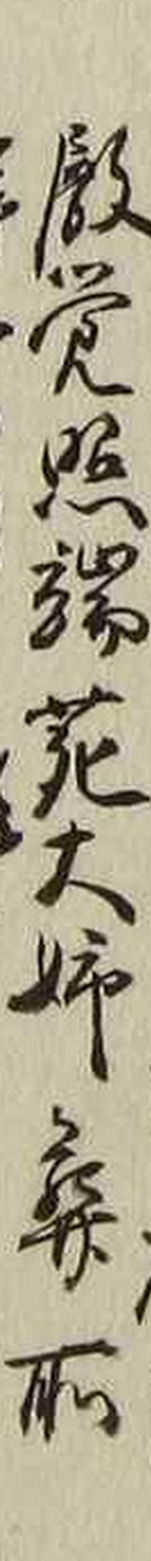殿覚照端苑大姉葬所
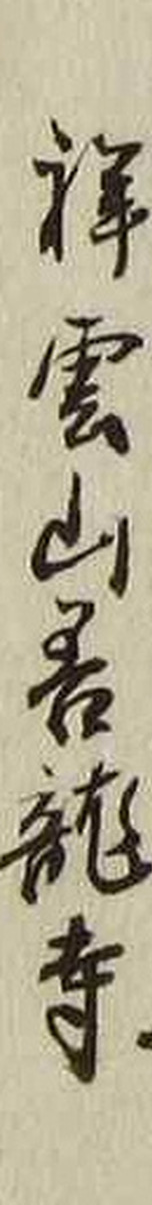祥雲山善龍寺
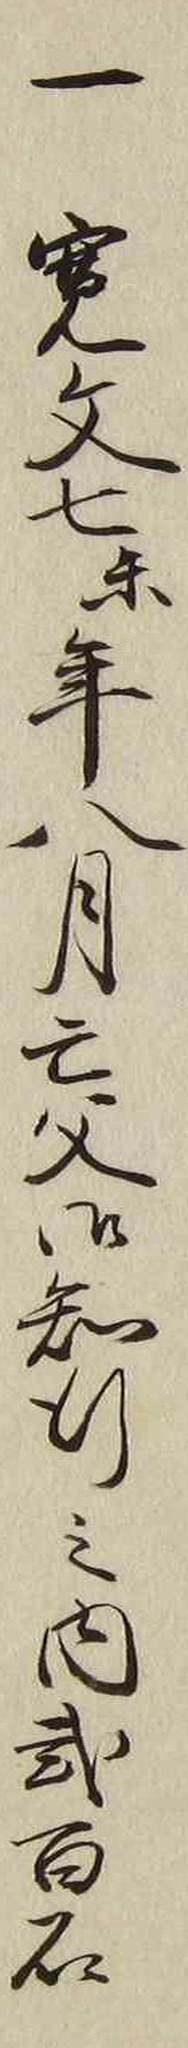一寛文七未年八月亡父御知行之内弐百石
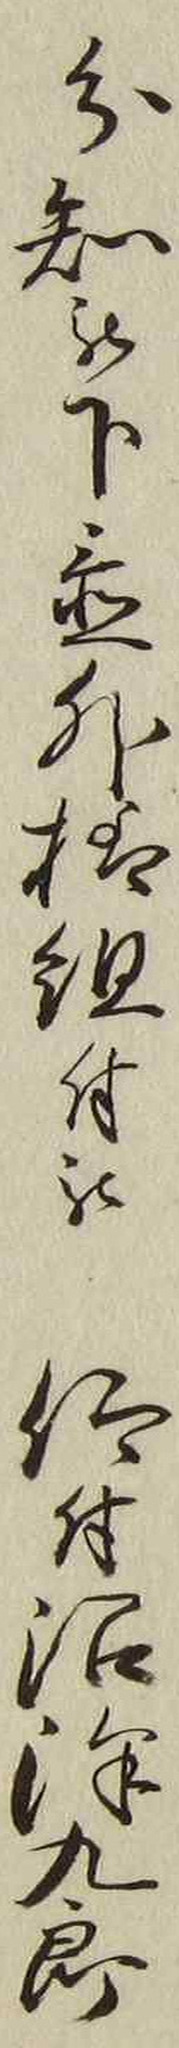分知被下置外様組付被仰付沼津九郎
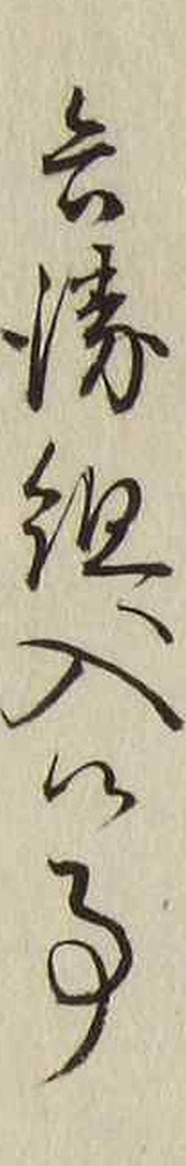兵衛組へ入候事

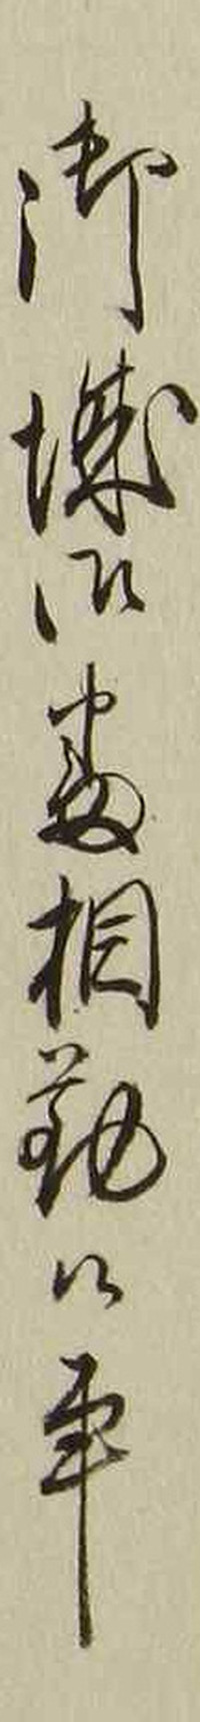不詳御城御番相勤候事
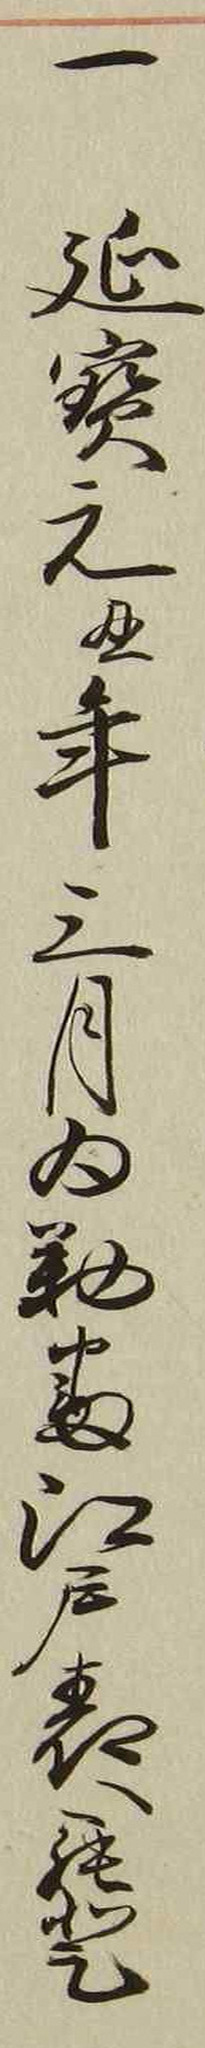一延宝元丑年三月内勤番江戸表へ罷登
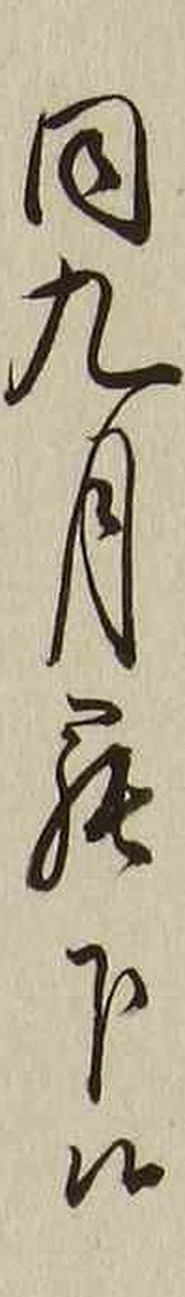同九月罷下候
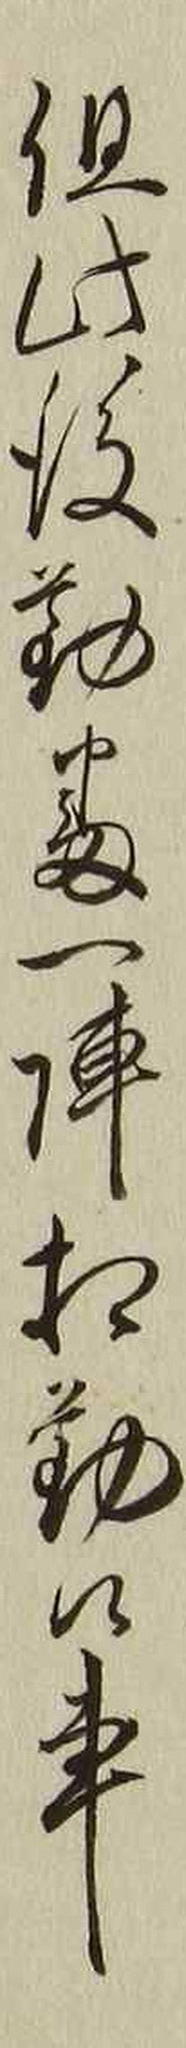但此後勤番一陣相勤候事
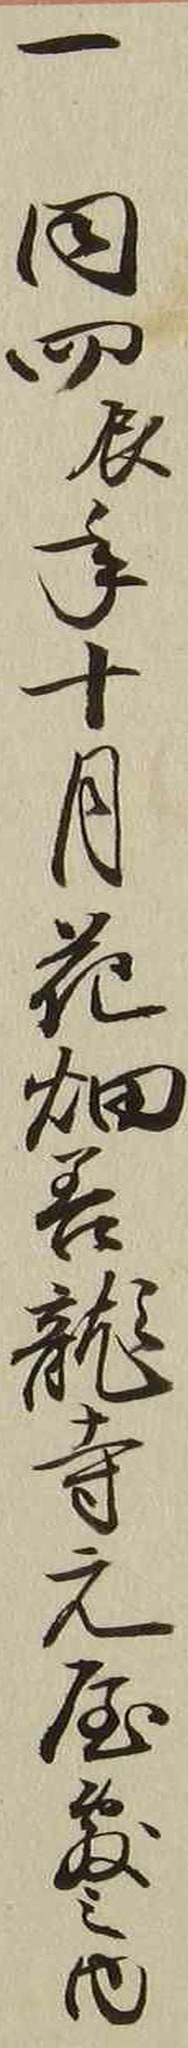一同四辰年十月花畑善龍寺元屋敷之内
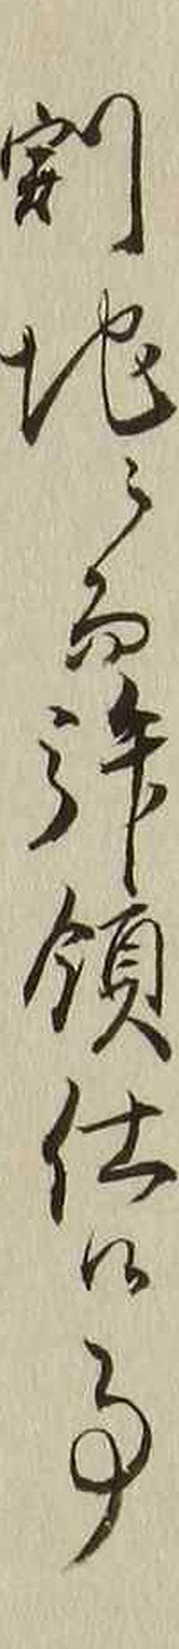割地ニ而拝領仕候事
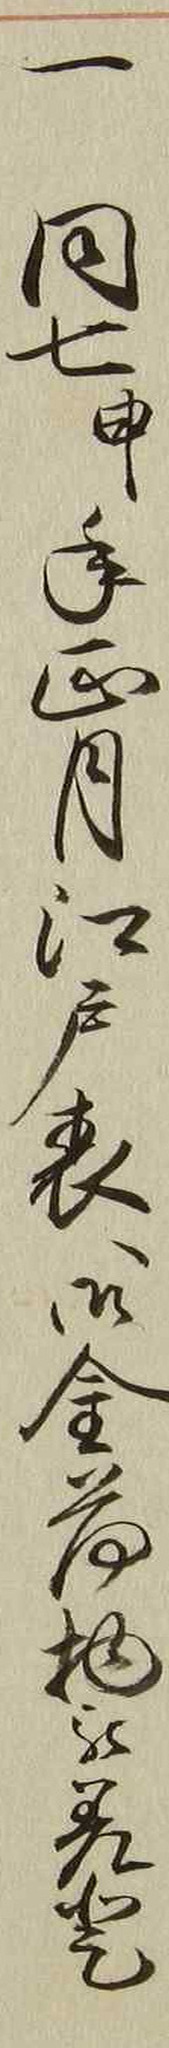一同七申年正月江戸表へ御金荷物被差登
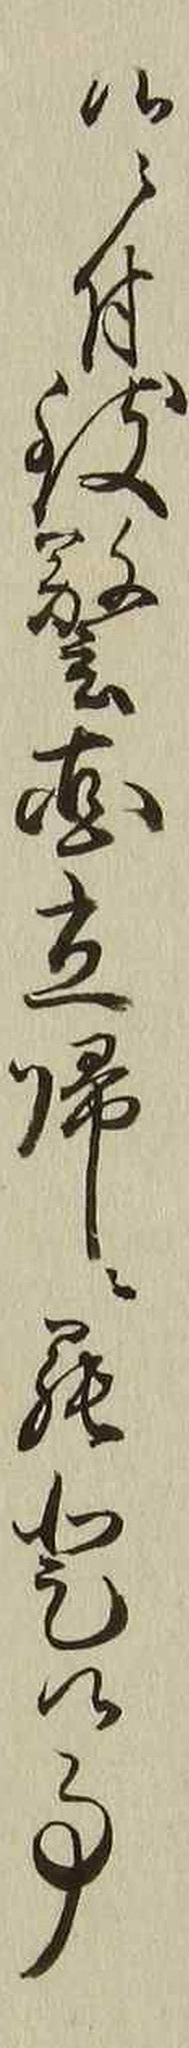候ニ付致警固立帰ニ罷登候事
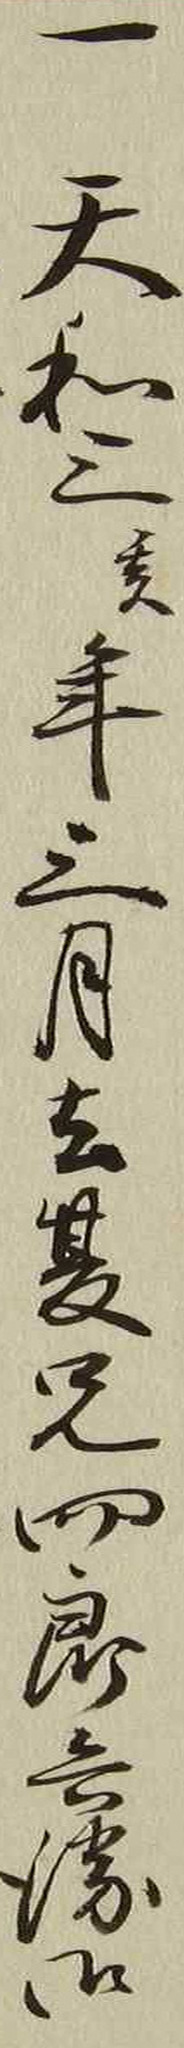一天和三亥年三月去夏兄四郎兵衛御
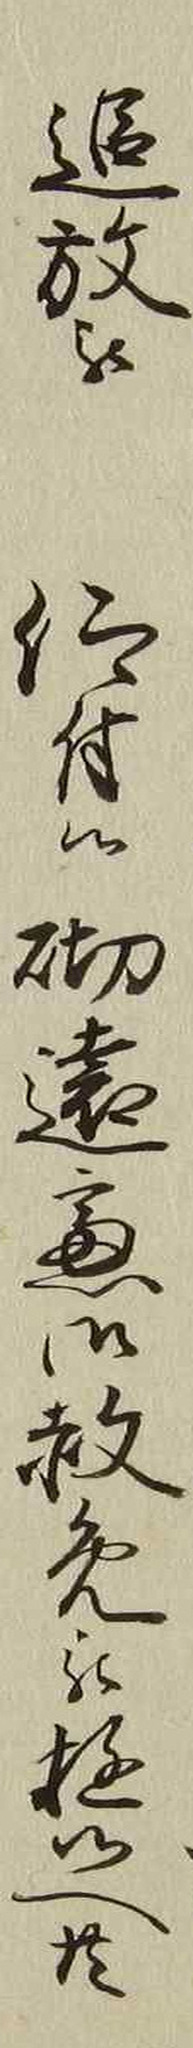追放被仰付候砌遠慮御赦免被遊候へ共
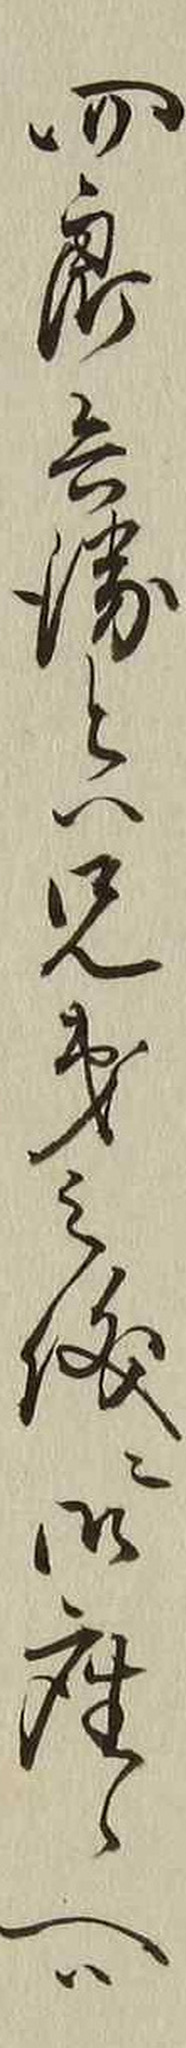四郎兵衛とハ兄弟之儀ニ御座候ヘハ
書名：諸士系譜　巻之21　い之部21
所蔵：会津若松市立会津図書館
